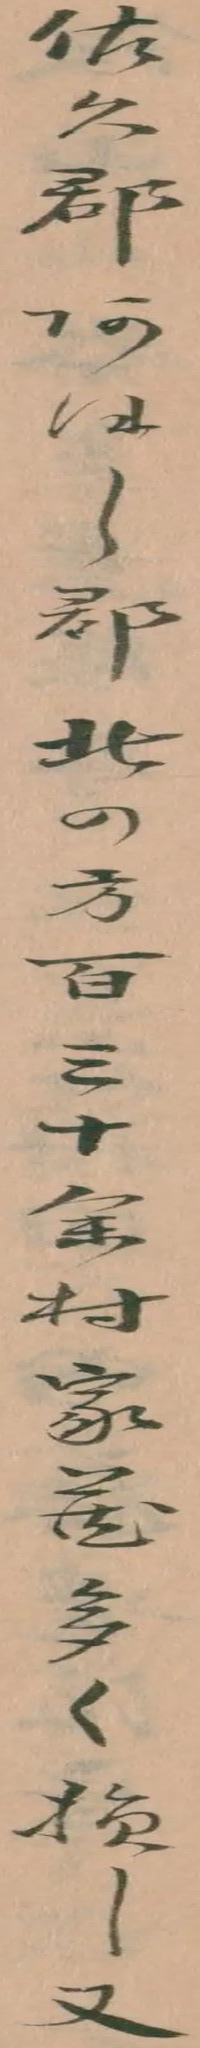佐久郡あずし郡北の方百三十余村家蔵多く損し又
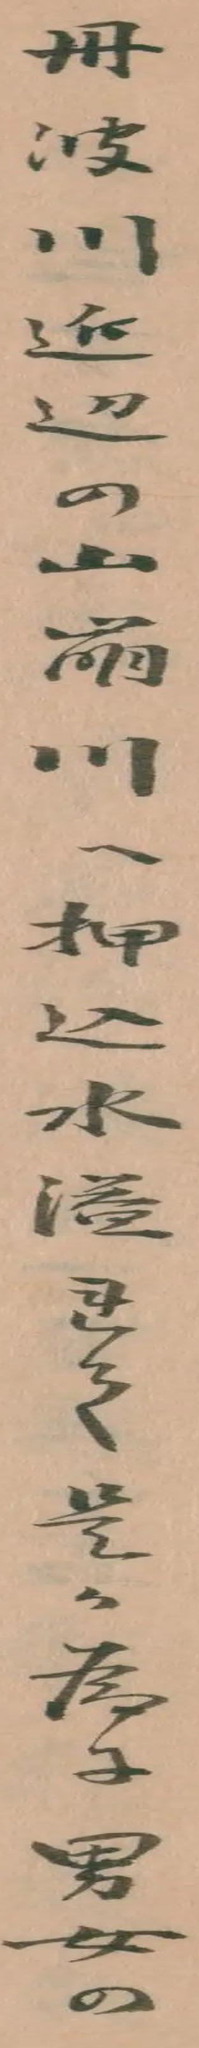丹波川近辺の山崩川へ押込水溢れてこれか為に男女の
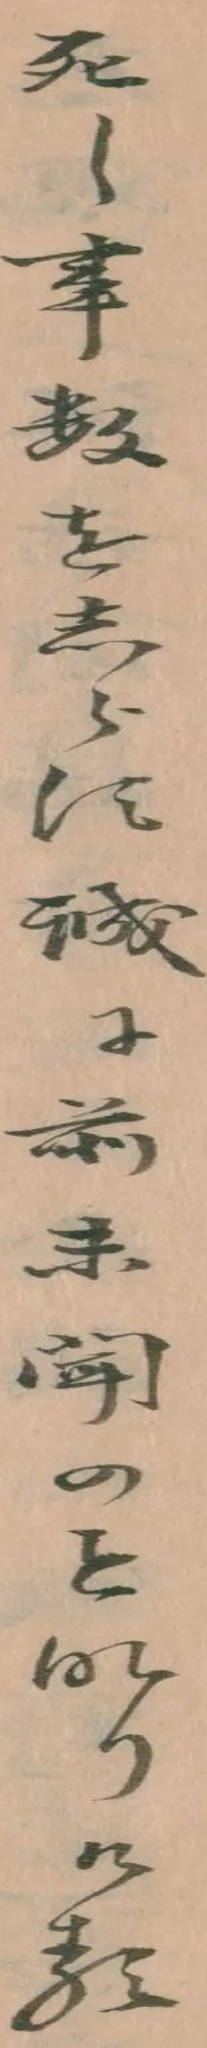死し事数をしらす誠に前未聞のことなりける
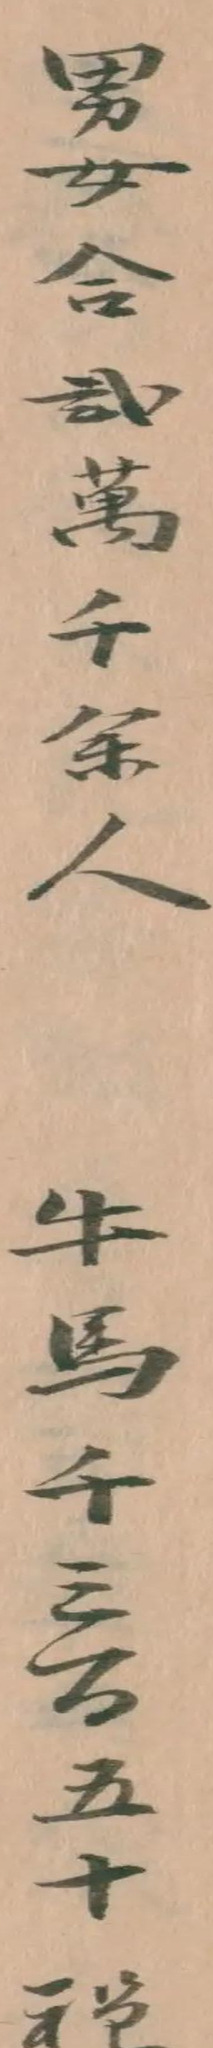男女合弐万千余人牛馬千三百五十程
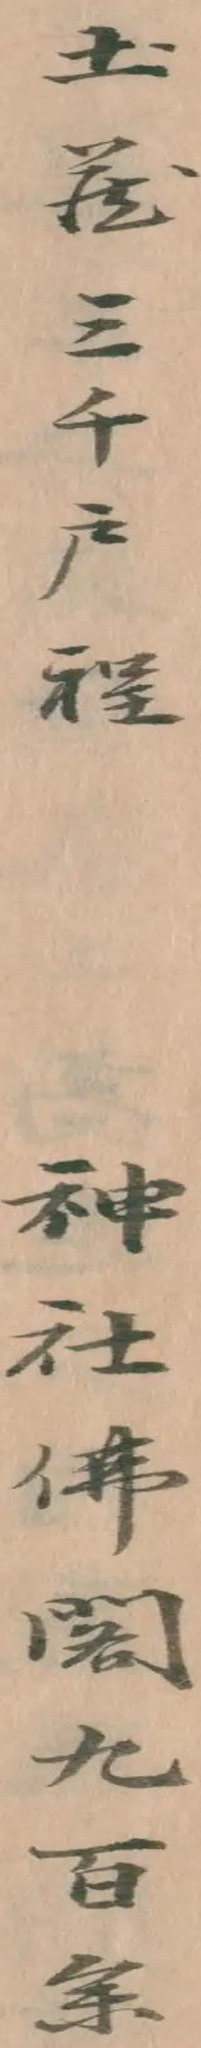土蔵三千戸程神社仏閣九百余
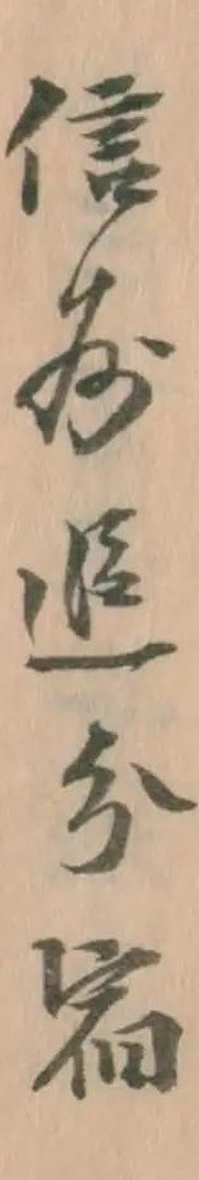信州追分宿
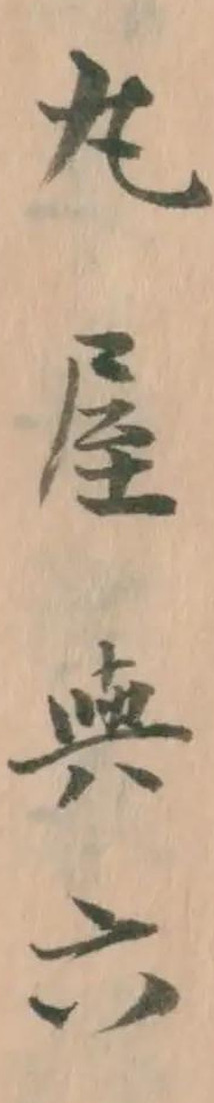丸屋与六

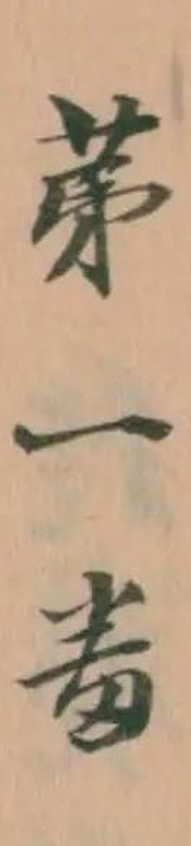第一番
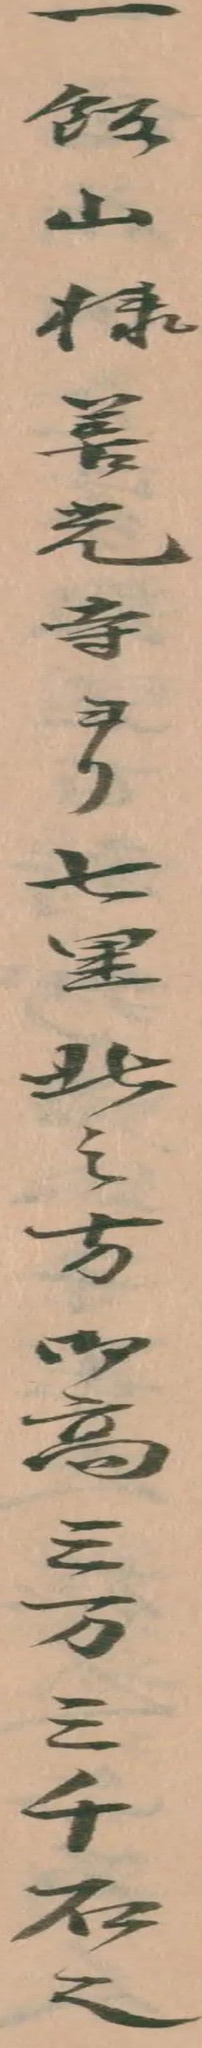一飯山様善光寺ヨリ七里北之方御高三万三千石也
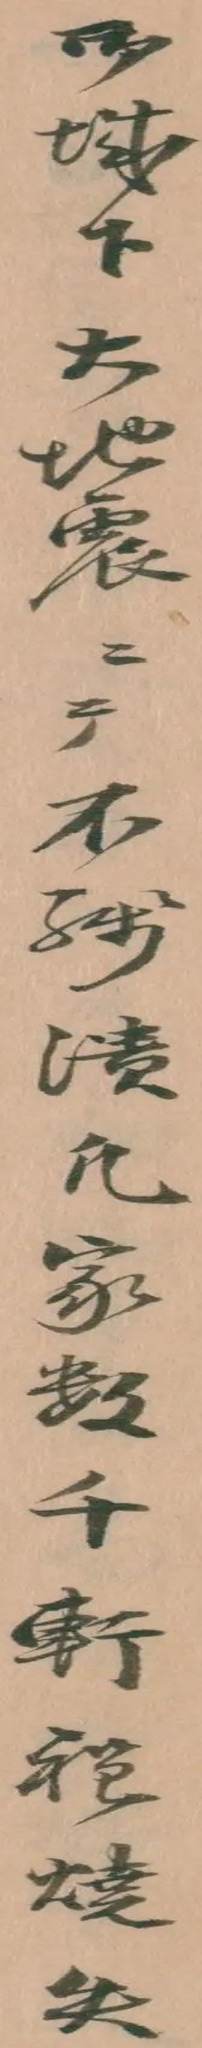御城下大地震二テ不残潰凡家数千軒程焼失
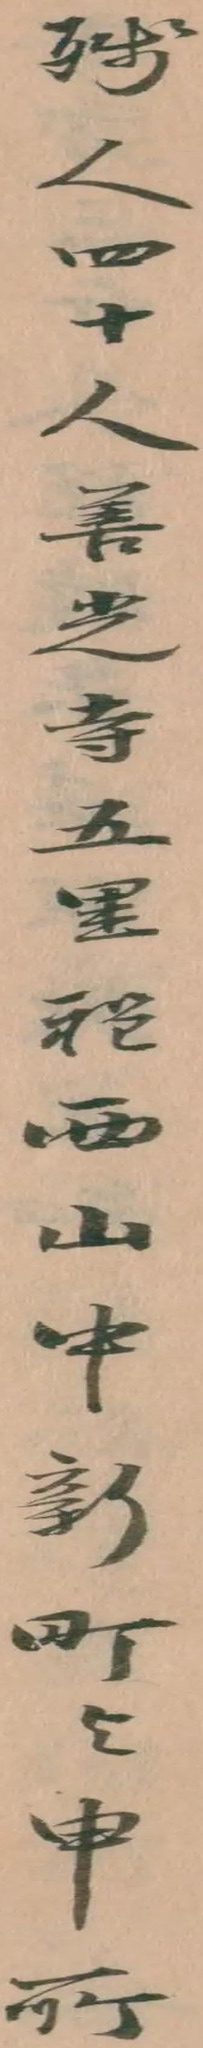残人四十人善光寺五里ほと西山中新町と申所
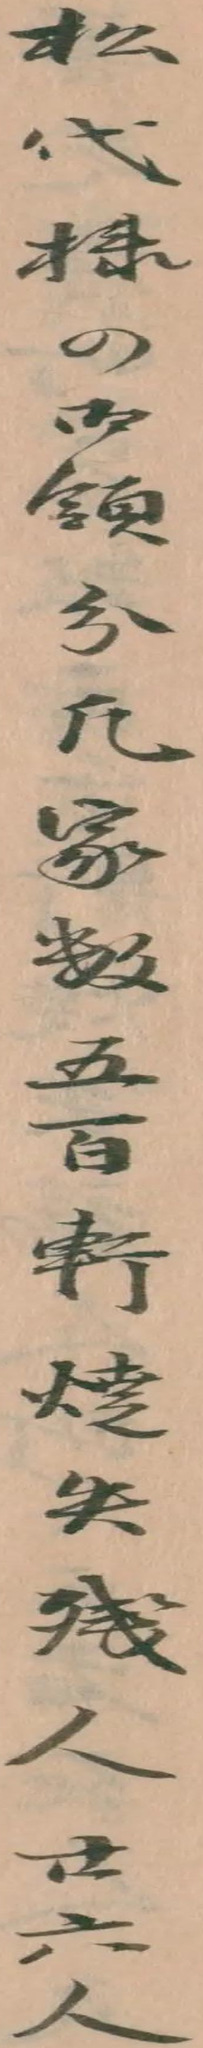松代様の御領分凡家数五百軒焼失残人廿六人
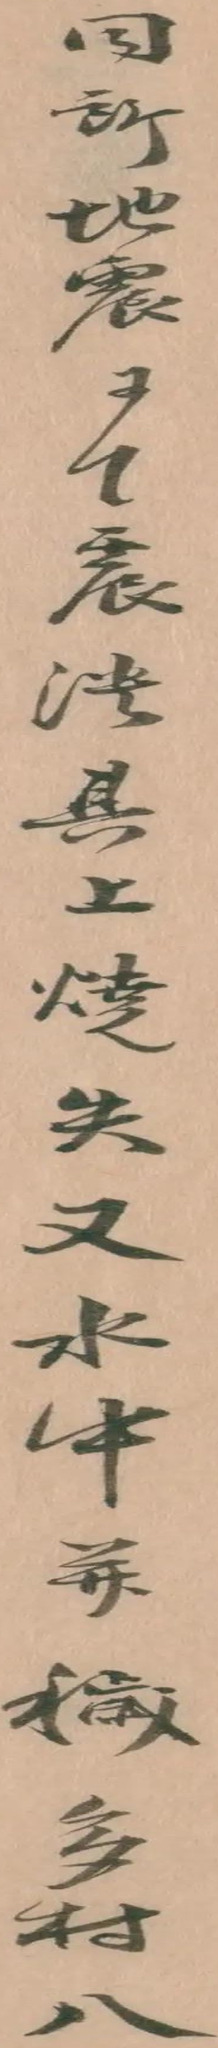同所地震にて震潰其上焼失又水中并穢多村八
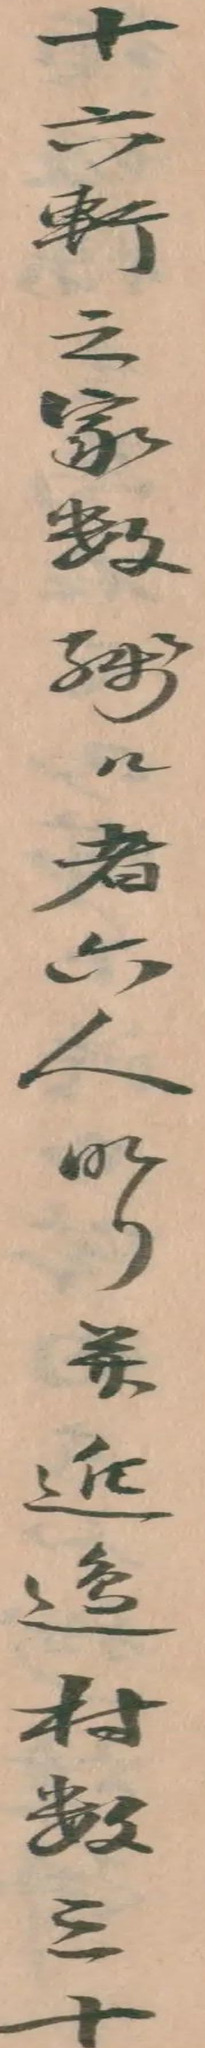十六軒之家数残ル者六人なり并近辺村数三十
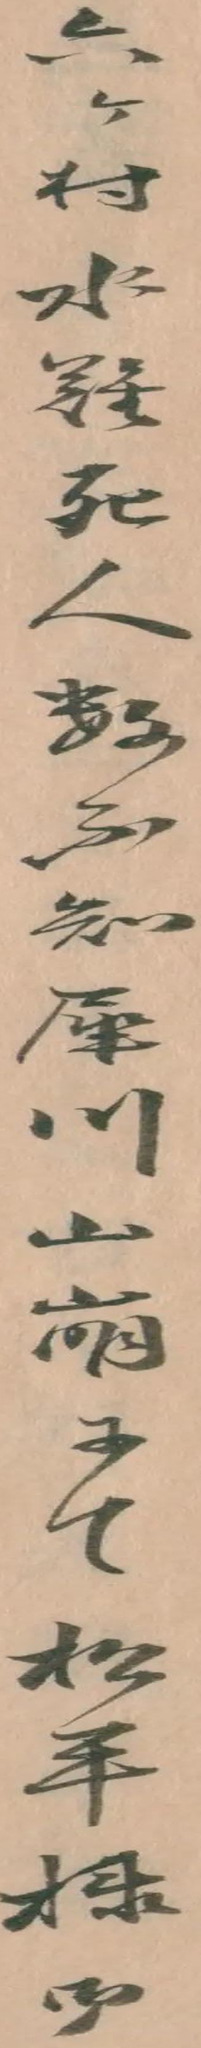六ヶ村水難死人数不知犀川山崩にて松平様御
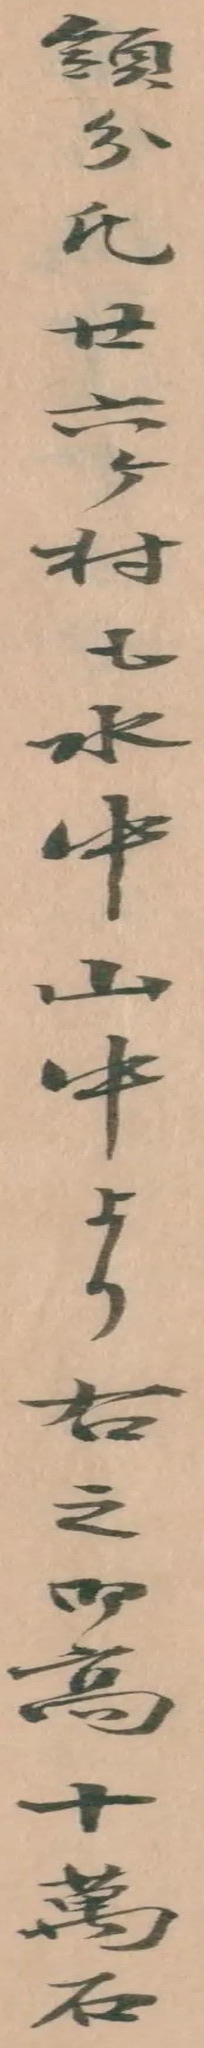領分凡廿六ヶ村も水中山中ゟ右之御高十万石
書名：地災撮要. 巻3(地震之部)-巻4(噴火之部)
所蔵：国立国会図書館 National Diet Library, JAPAN
